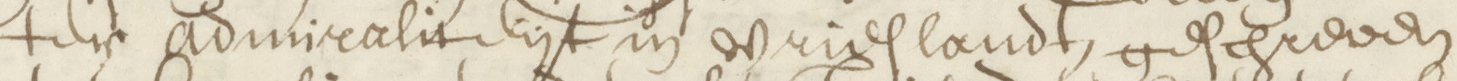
ter Admiraliteijt in Vrieslandt, geschreven
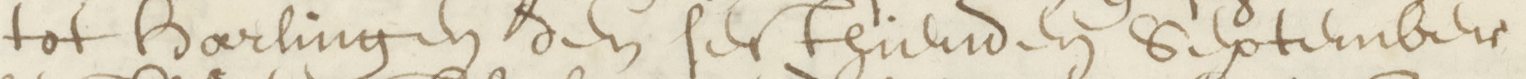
tot Harlingen den sesthienden September
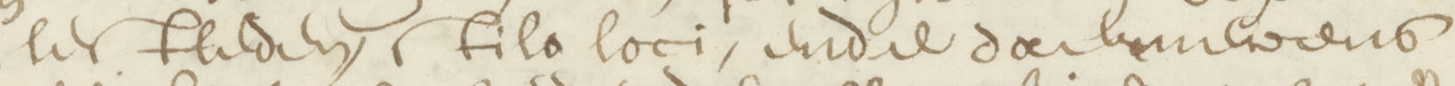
lestleden, stilo loci, ende daernevens
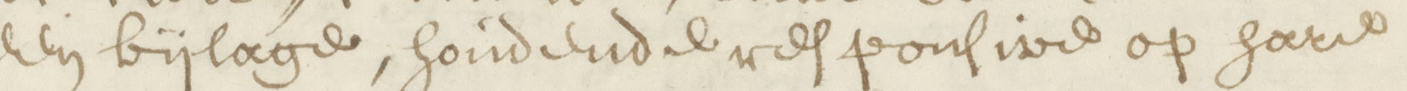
een bijlage, houdende responsive op hare
